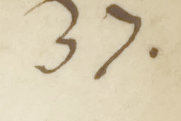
37.
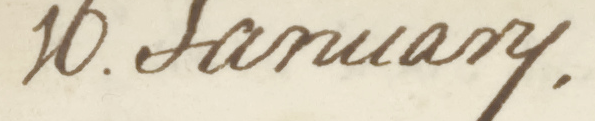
16. January.
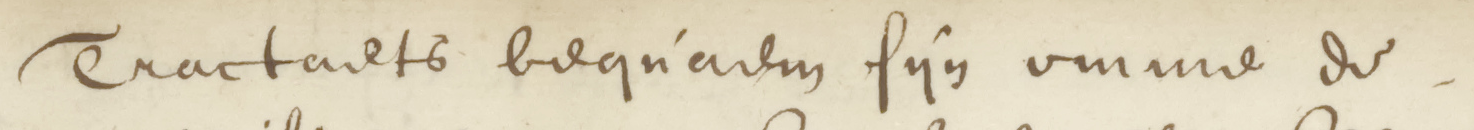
Tractaets bequaem sijn omme de
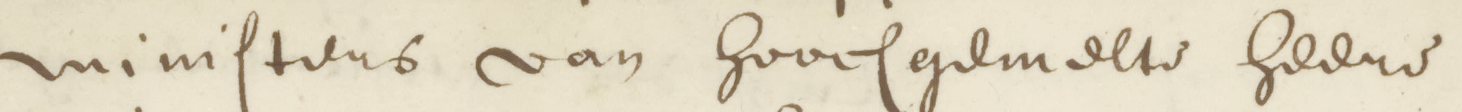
ministers van hoochgemelte heere
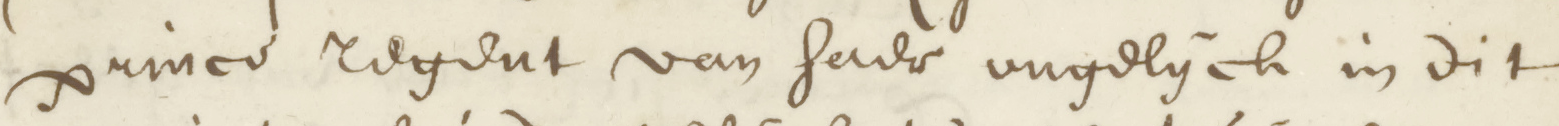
prince regent van haer ongelijck in dit
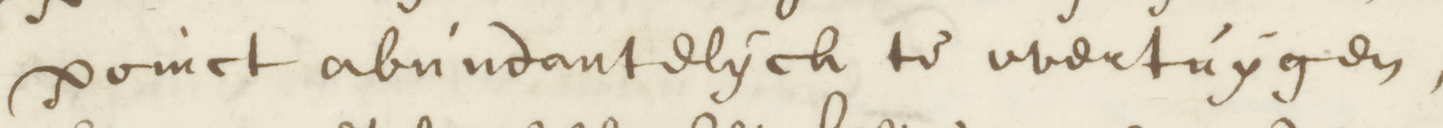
poinct abundantelijck te overtuijgen,
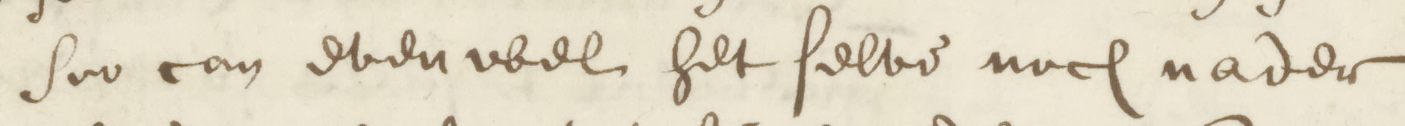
soo can evenwel het selve noch nader
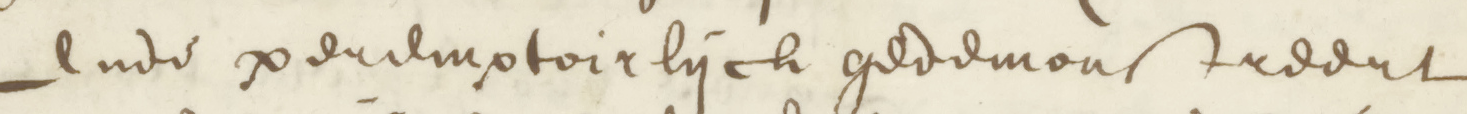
ende peremptoirlijck gedemonstreert
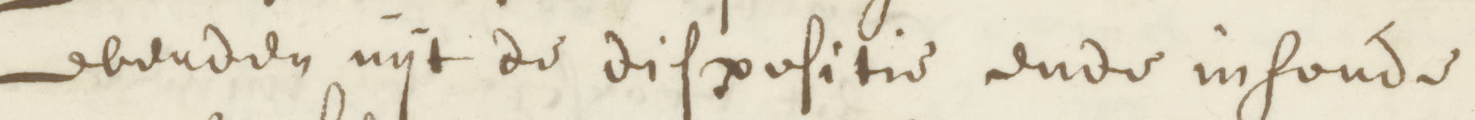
werden uijt de dispositie ende inhoude
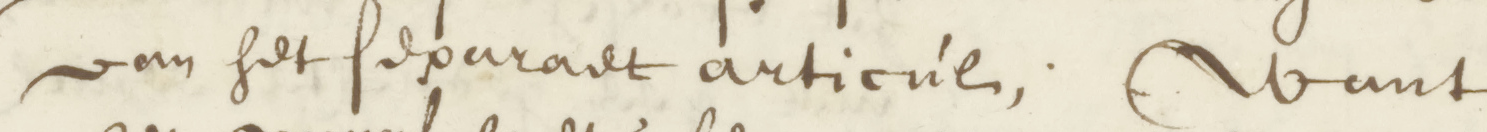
van het separaet articul; Want
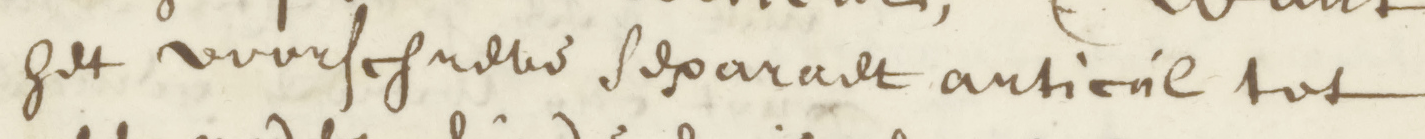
het voorschreve separaet articul tot
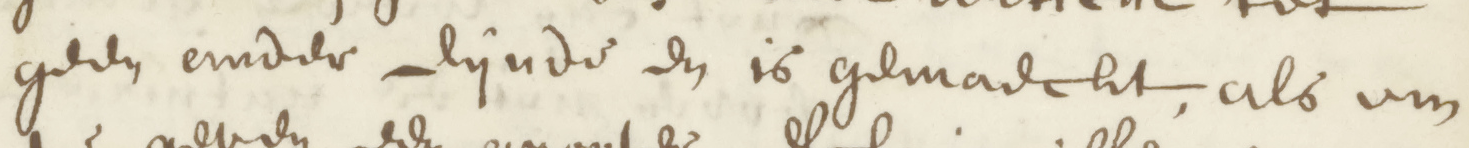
geen ander eijnde en is gemaeckt, als om
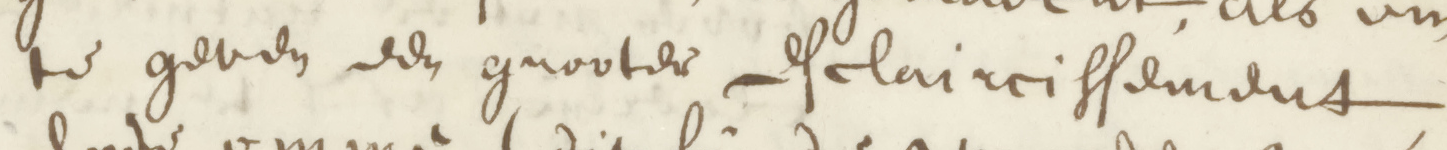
te geven een grooter esclaircissement,
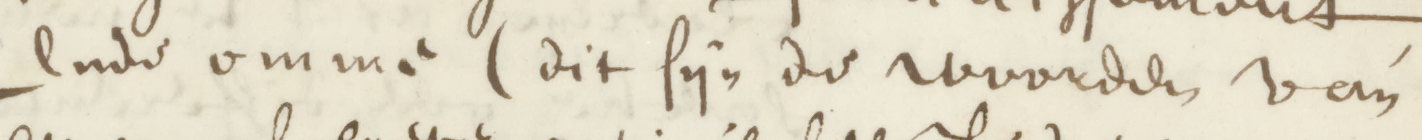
Ende omme (dit sijn de woorden van
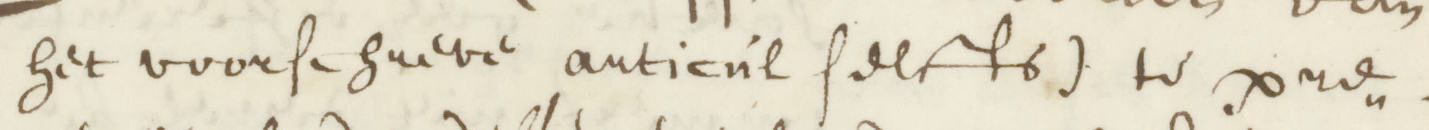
het voorschreve articul selffs) te pre„
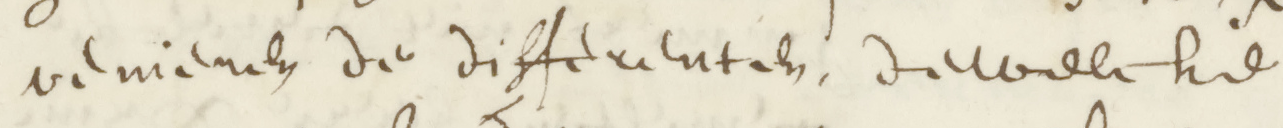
venieren de differenten, dewelcke
